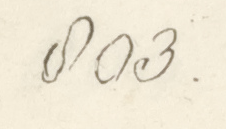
803.
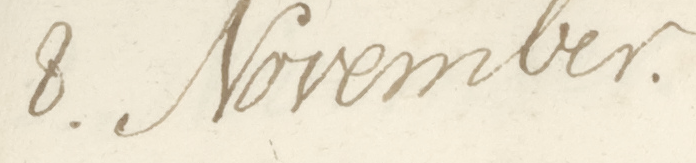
8. November.
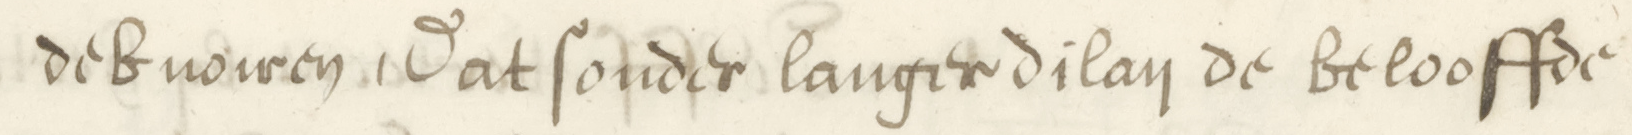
debuoiren, dat sonder langer dilay de belooffde
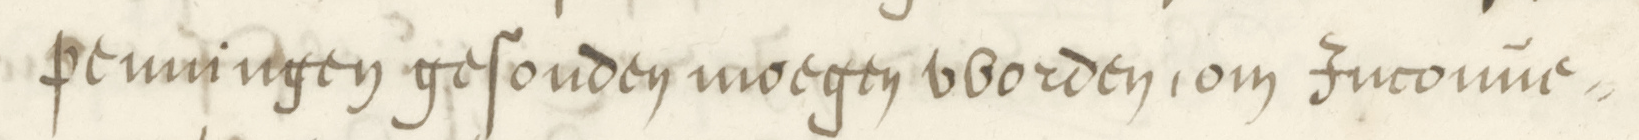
penningen gesonden moegen worden om Inconue„
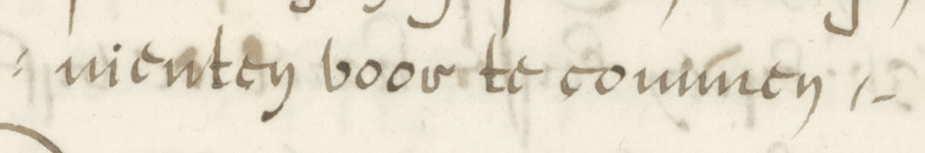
nienten voor te commen.
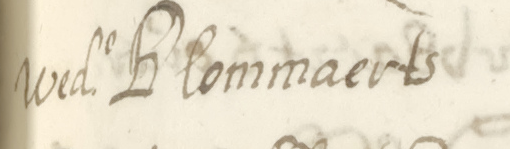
Wede. Blommaerts
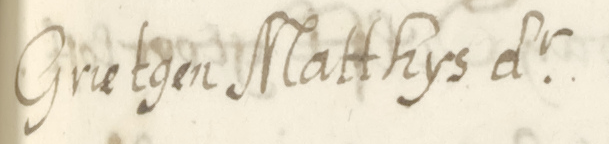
Grietgen Matthys dr
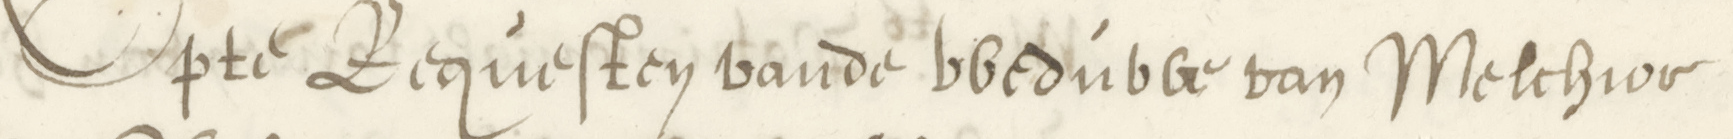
Opte Requesten vande weduwe van Melchior
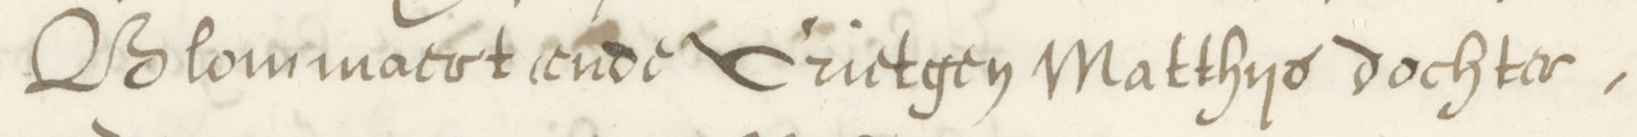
Blommaert, ende Grietgen Matthys dochter
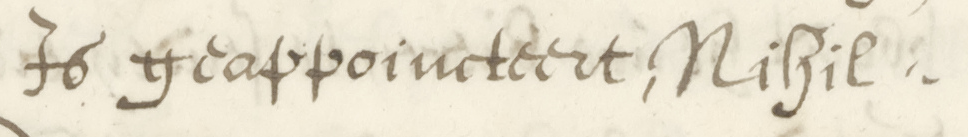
Is geappoincteert, Nihil.
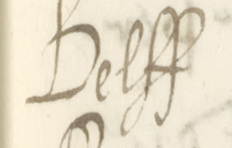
Delff
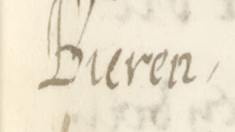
Bieren
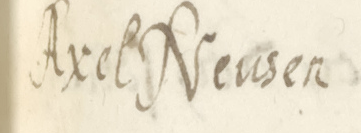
Axel Neusen
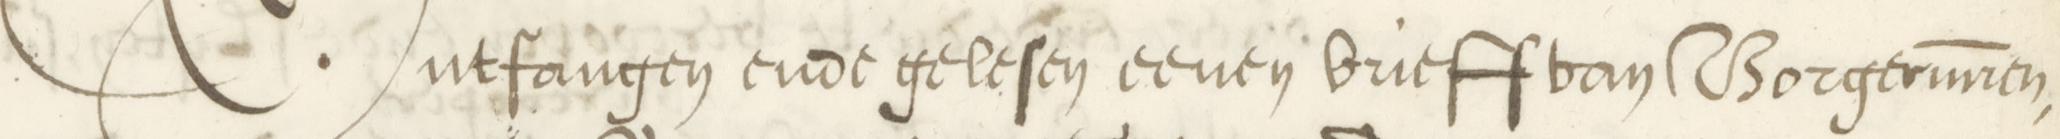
Ontfangen ende gelesen eenen brieff van Borgermren
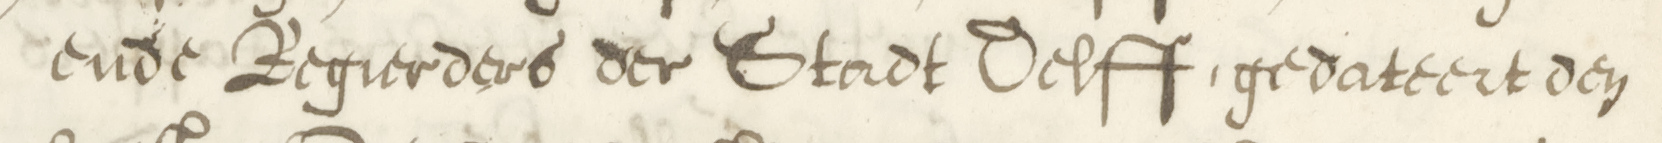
ende Regierders der Stadt Delff, gedateert den
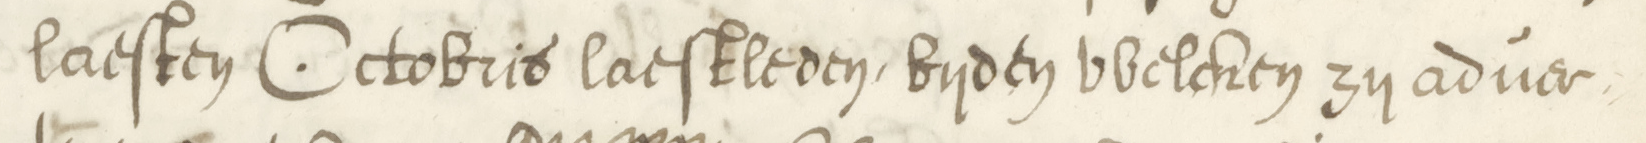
laesten Octobris laestleden, byden welkcken zij aduer„
